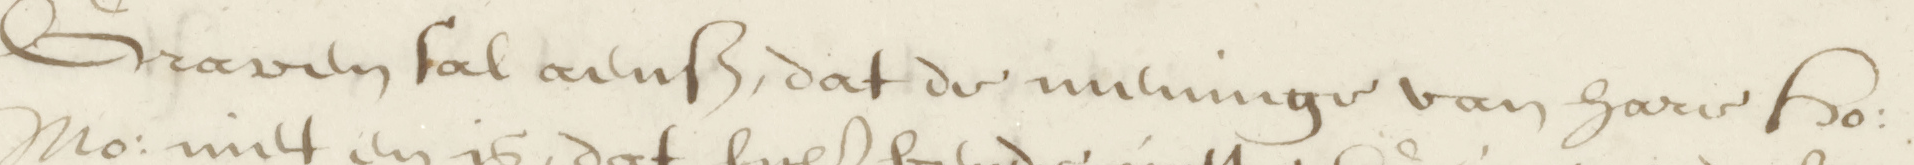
Graven sal aens, dat de meninge van hare Ho:
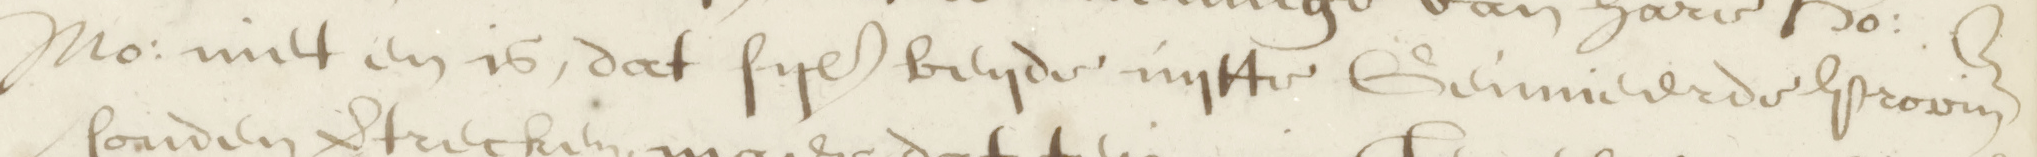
Mo: niet en is, dat syl beyde uytte Geunieerde Provin
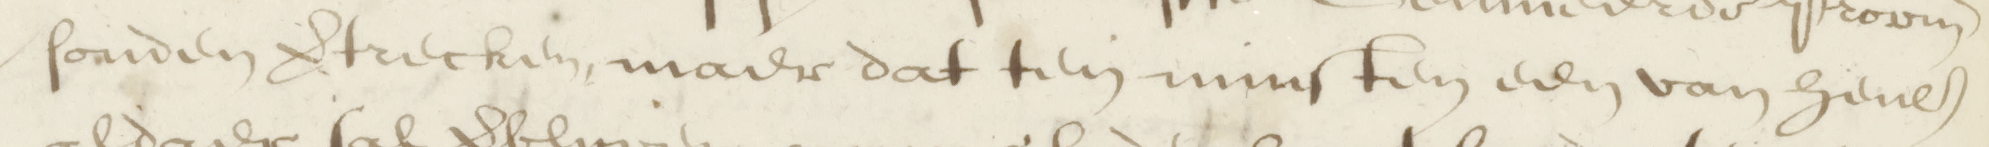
souden vtrecken, maer dat ten minsten een van henl
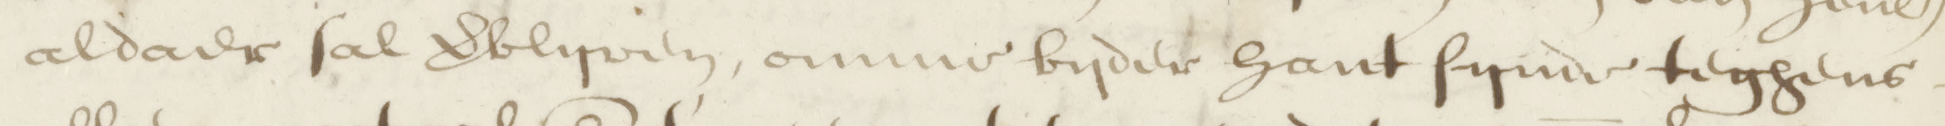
aldaer sal vblyven, omme byder hant sijnde teghens
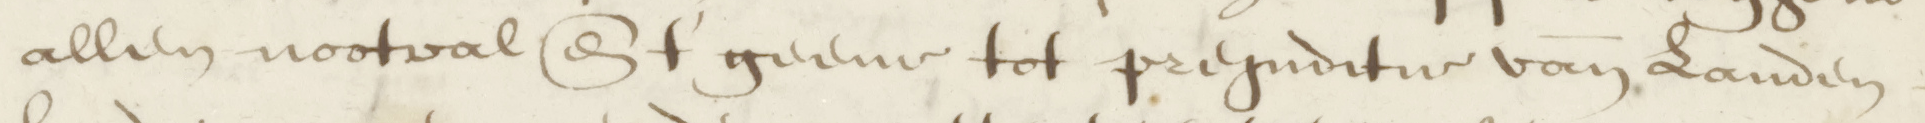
allen nootval & t'geene tot prejuditie van Landen
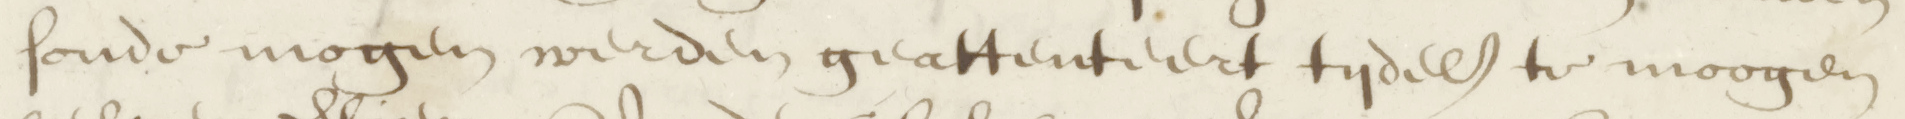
soude mogen werden geattenteert tydel te moogen
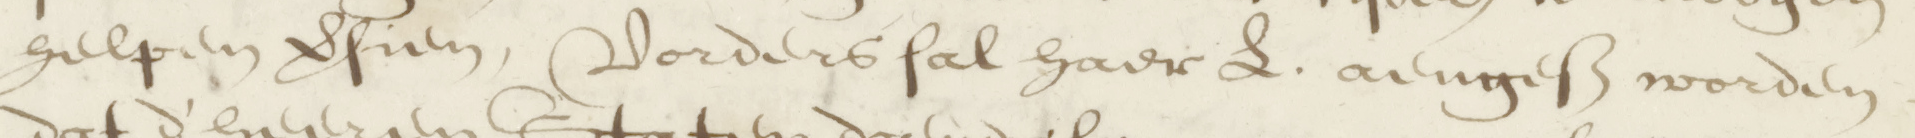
helpen vsien, Vorders sal haer L. aenges worden
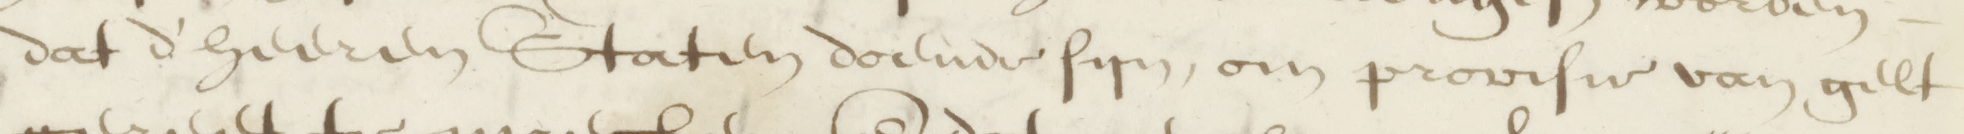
dat d'heeren Staten doende syn, om provisie van gelt
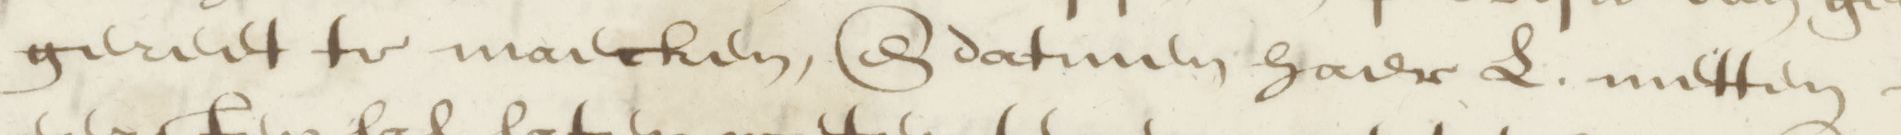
gereet te maecken, & datmen haer L. metten
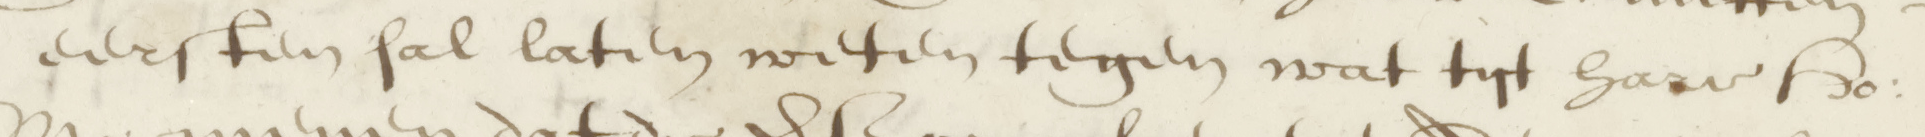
eersten sal laten weten tegen wat tijt hare Ho:
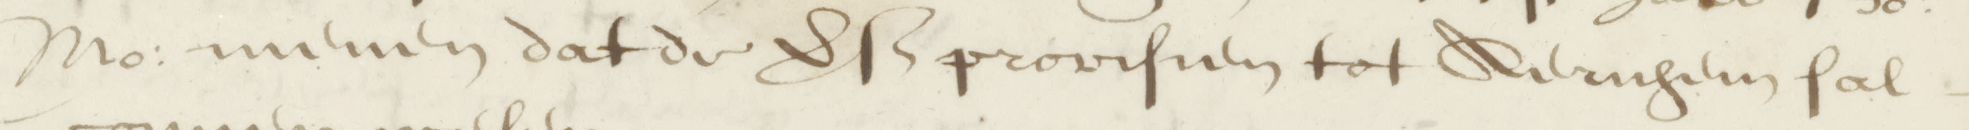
Mo: menen dat de vs provisien tot Aernhem sal
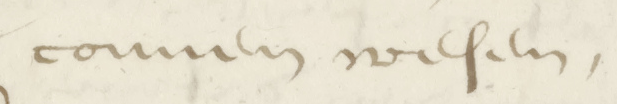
connen wesen.
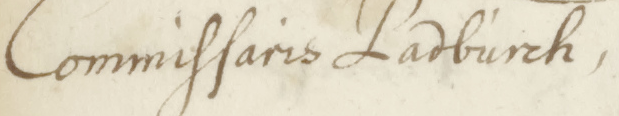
Commissaris Padburch,
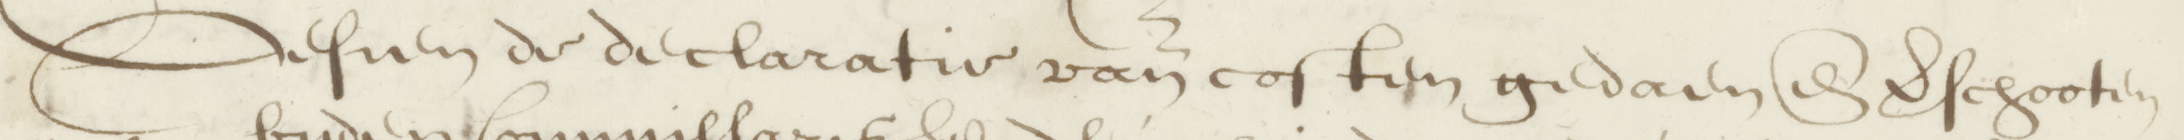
Gesien de declaratie van costen gedaen & vschooten
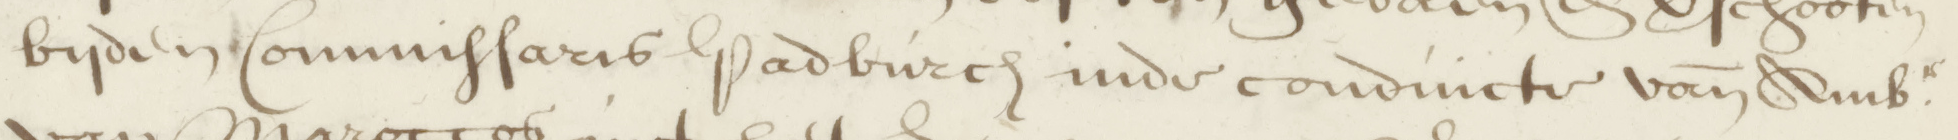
byden commissaris Padburch inde conduicte van Ambr.
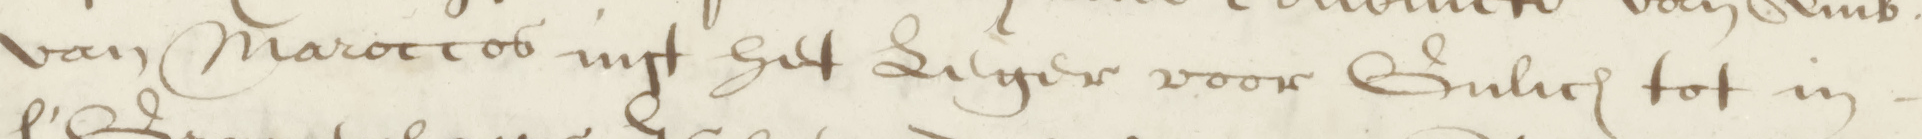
van Maroccos uijt het Leger voor Gulich tot in -
